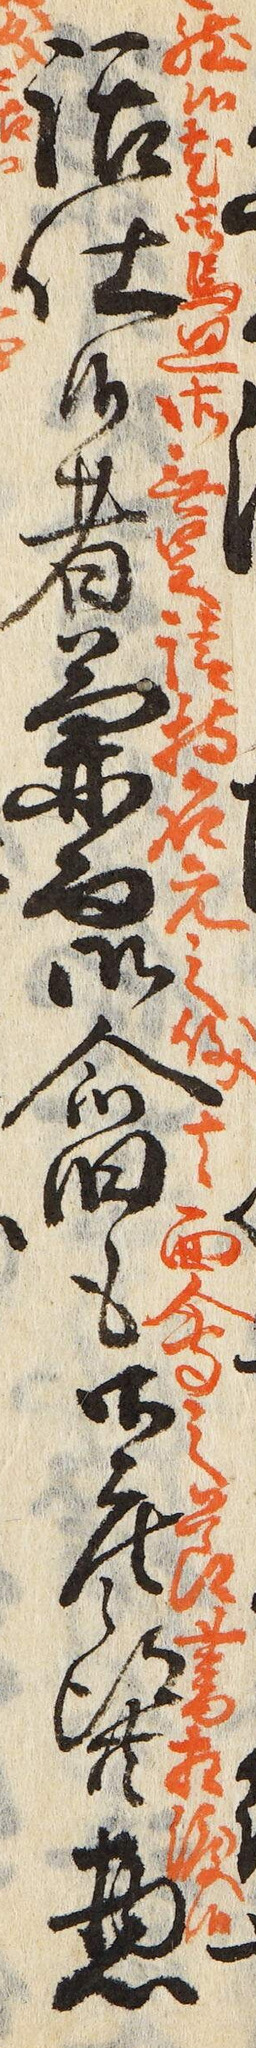話仕候者兼而御も御座候得共惣
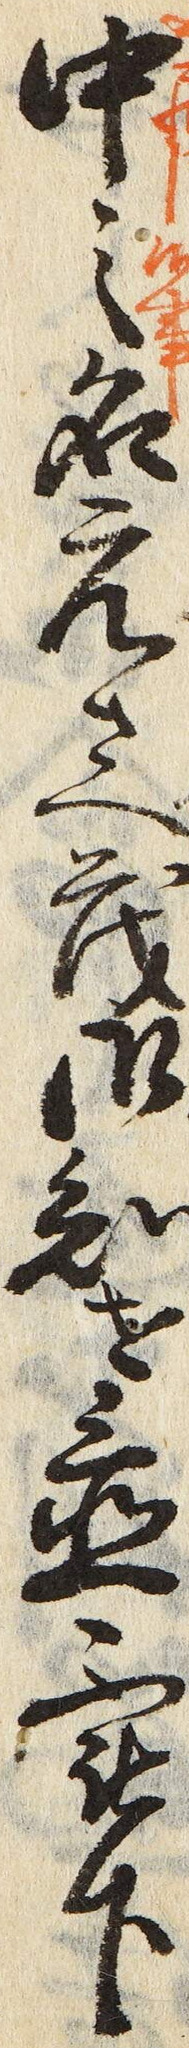中之名元さへも御知せ置不被下
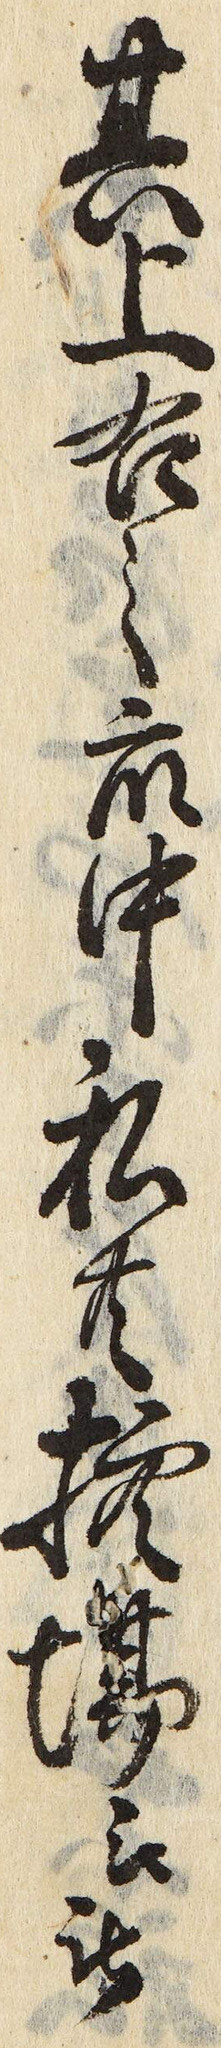其上右之衆中私共控場江被

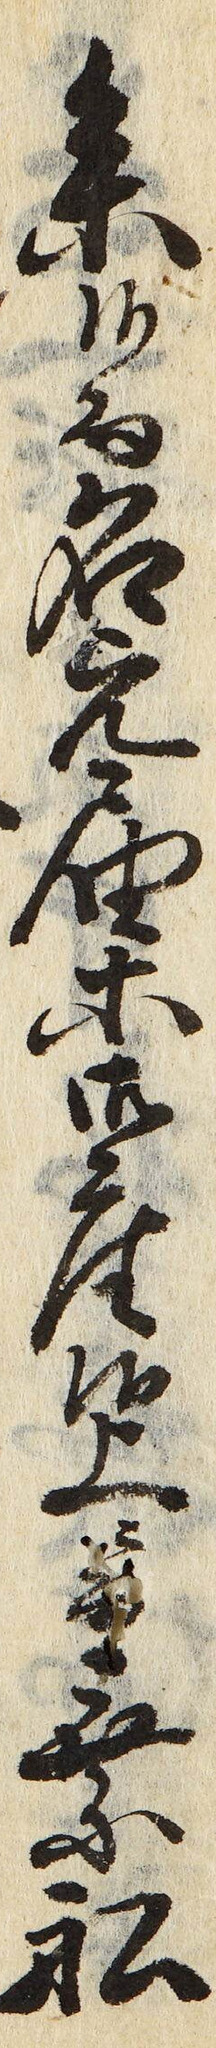参候而名元届等御座候上ニ而乗船
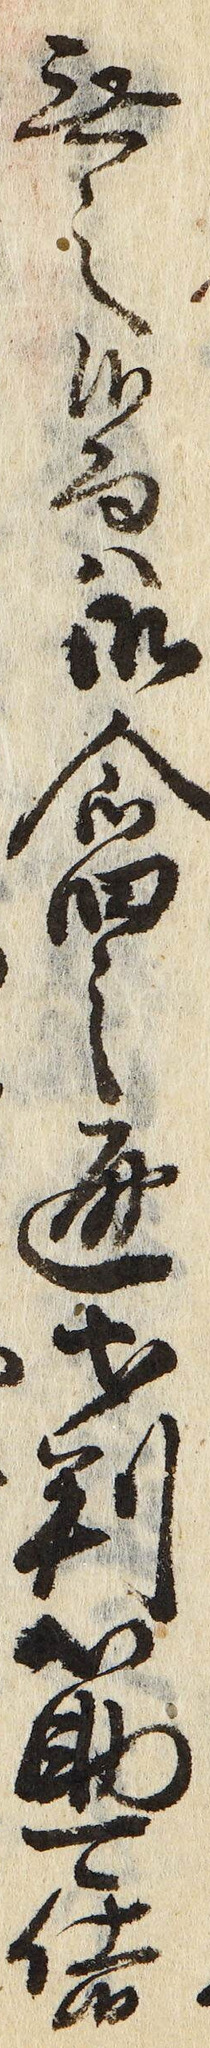無之候而ハ御之通才判筋可仕候
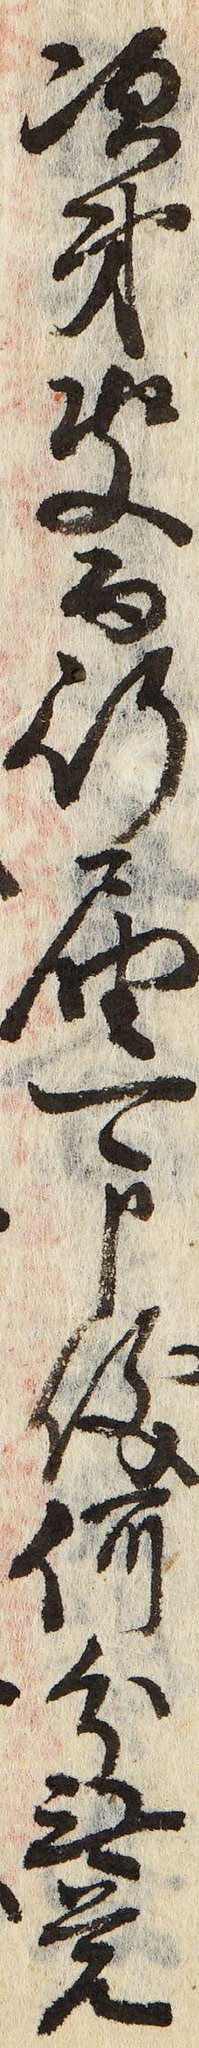次第決而行届可申儀何分無覚
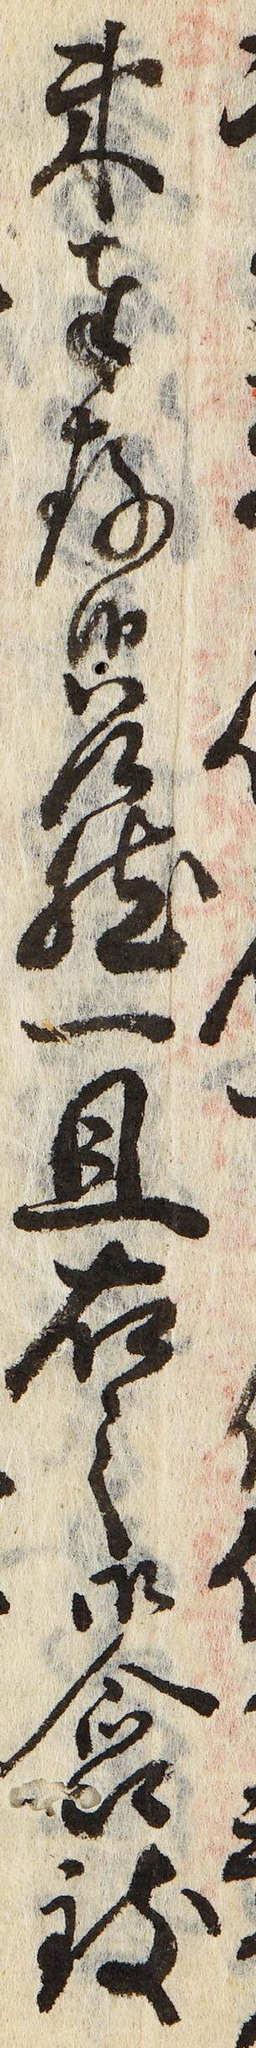束奉存候乍然一旦右之御含致
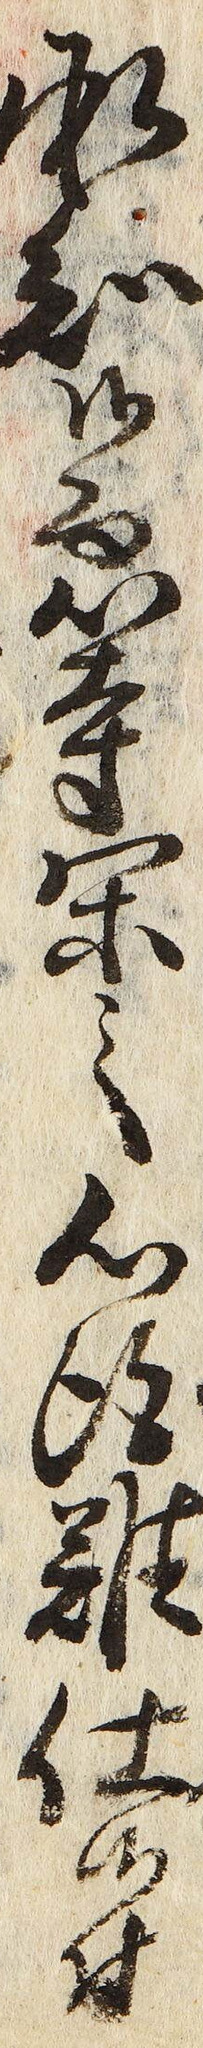承知候而等閑之心得難仕候付
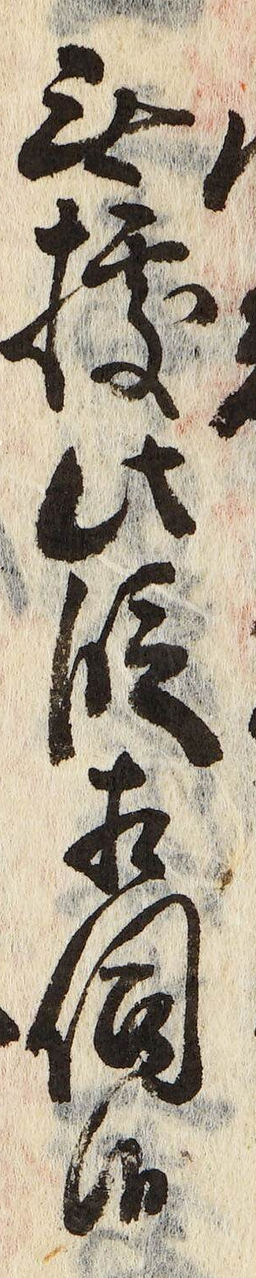無拠此段相伺候
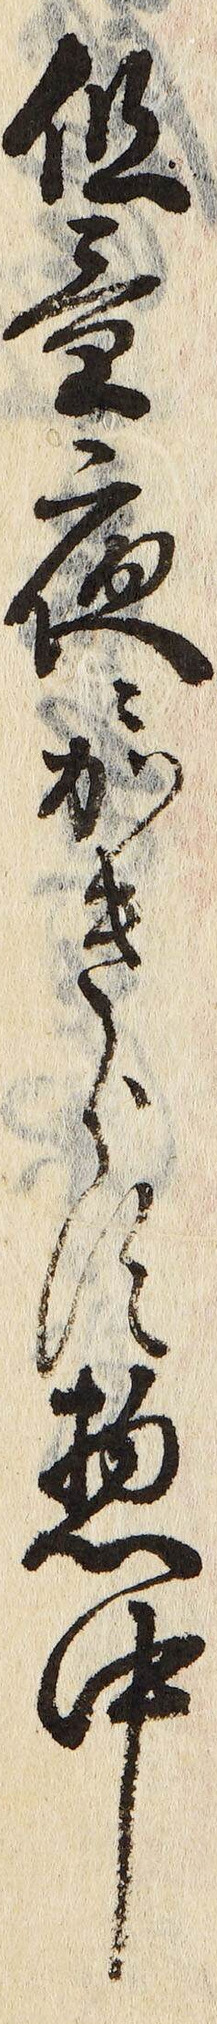但昼夜ニかきらす惣中
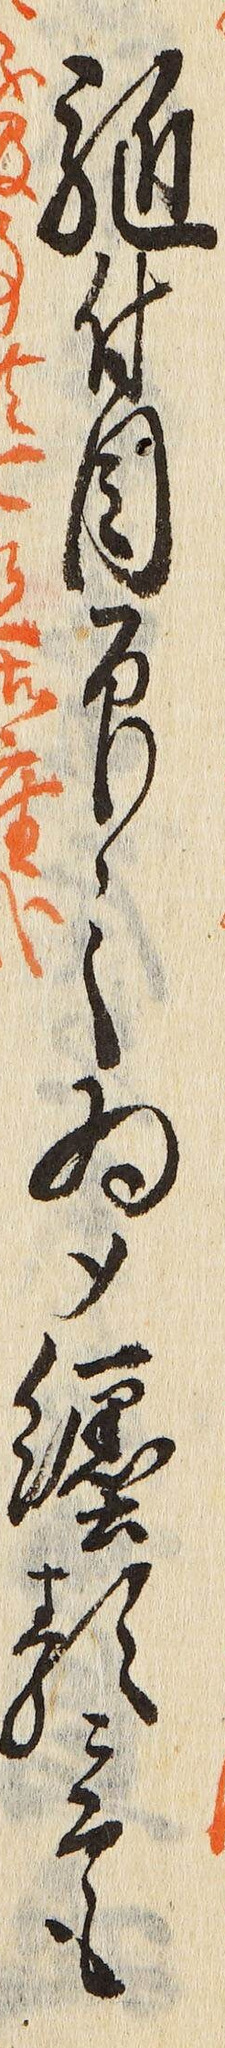駈付目印之為メ纏類ニ而も
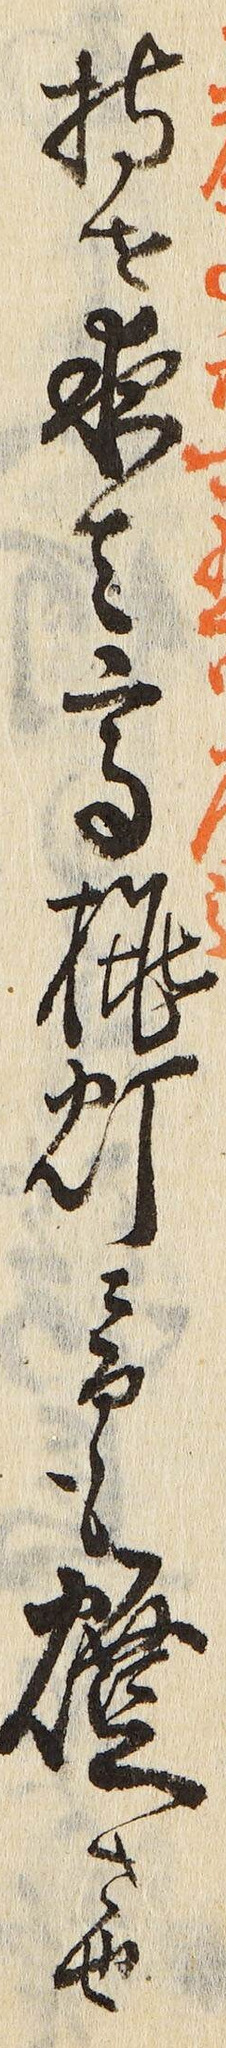持せ夜者高挑灯ニ而も燈させ
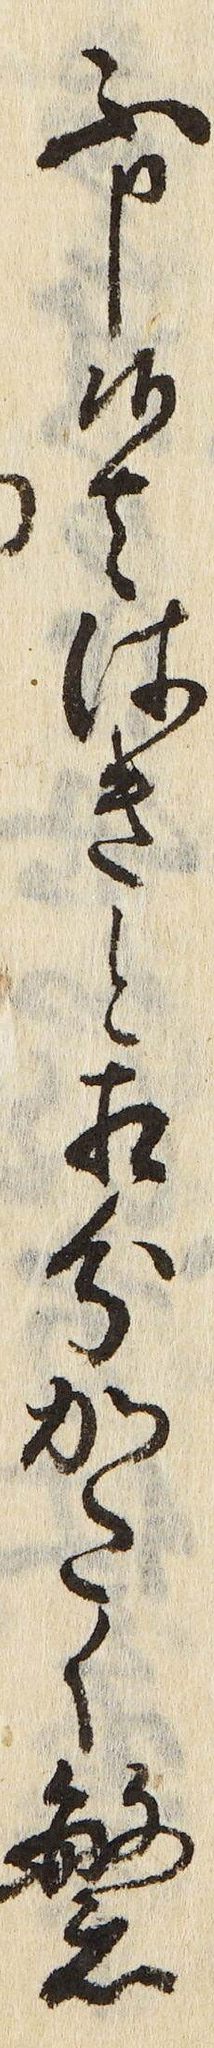不申候者はきと相分かたく繁
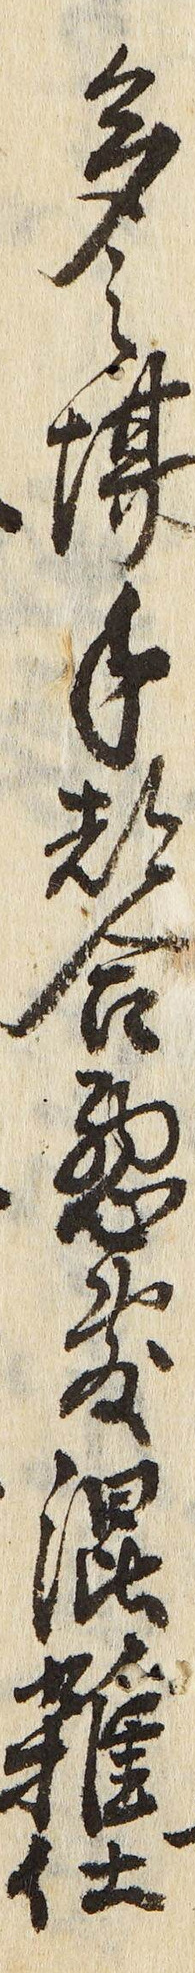多之場手都合悪敷混雑仕
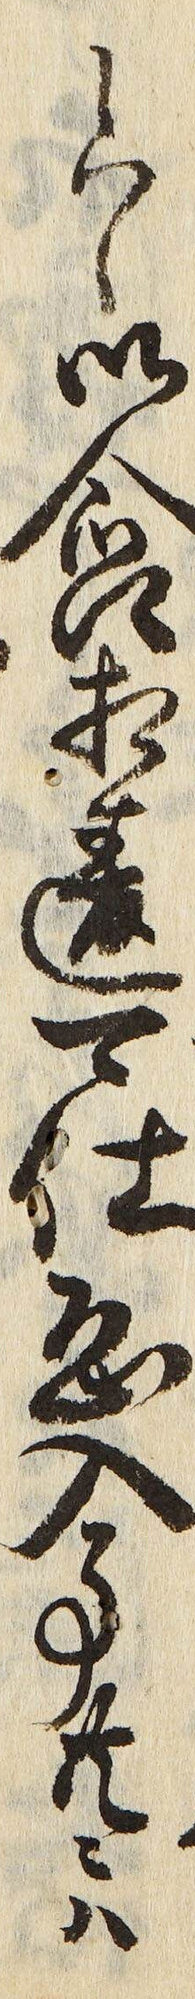候ハヽ御含相違可仕恐入事共ニハ
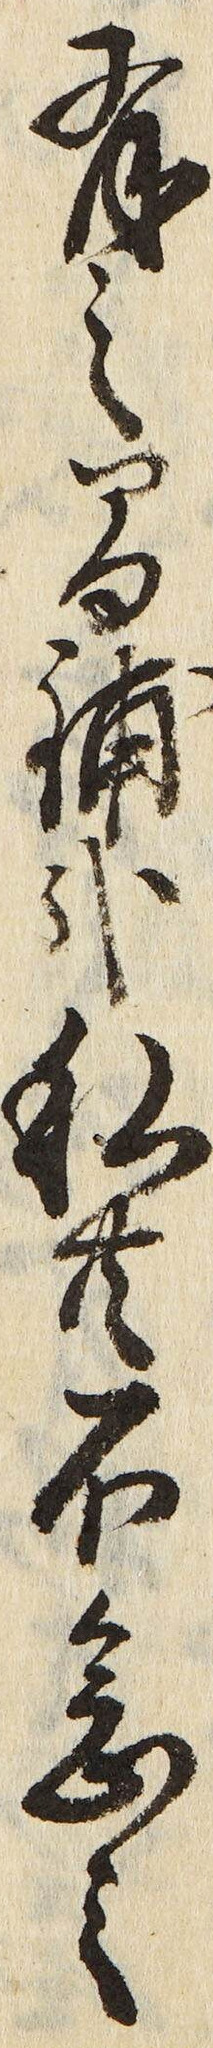有之間鋪哉私共不念之
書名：御領海江異国船漂流有之節御手当之次第大組頭心得之廉々書集記
